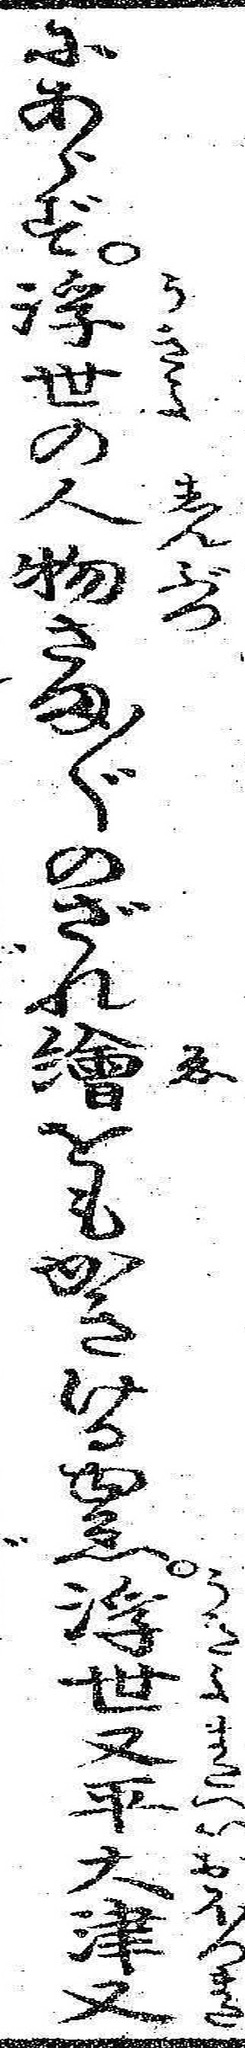にあらず。浮世の人物さま〴〵のざれ絵をもかきけるゆゑ。浮世又平大津又
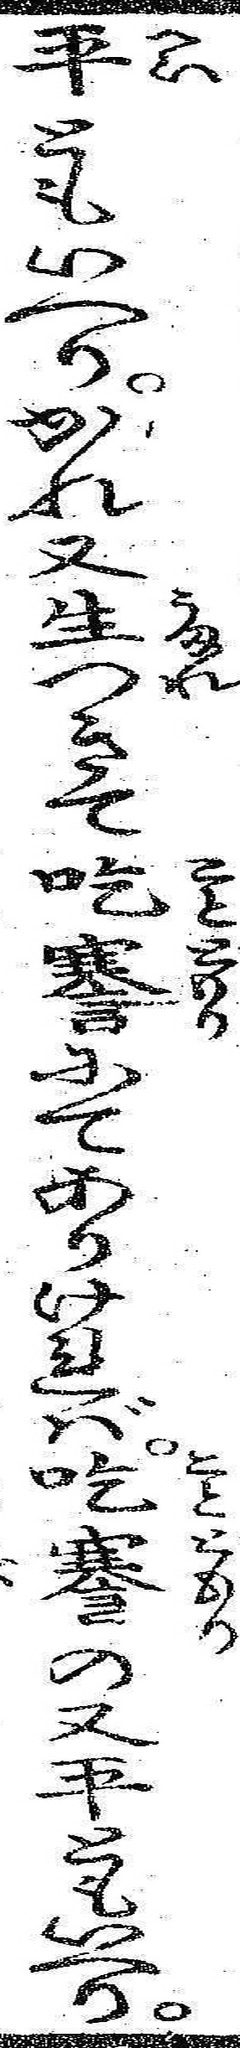平ともいへり。かれ又生つきて吃謇にてありければ。吃謇の又平ともいへり。
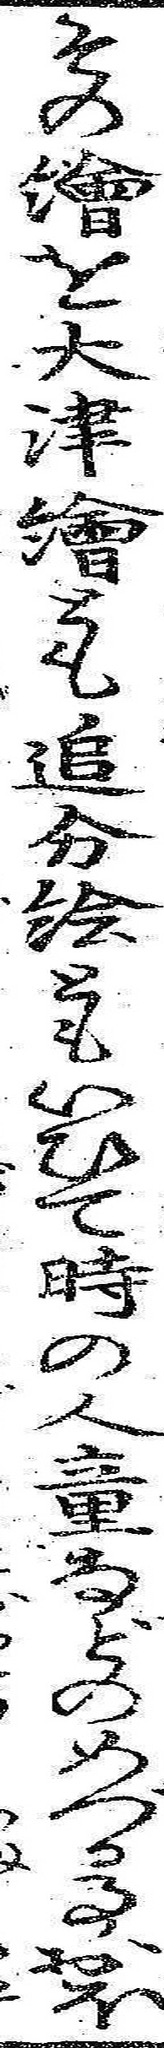その絵を大津絵とも追分絵ともいひて。時の人童などのめづる事おほ
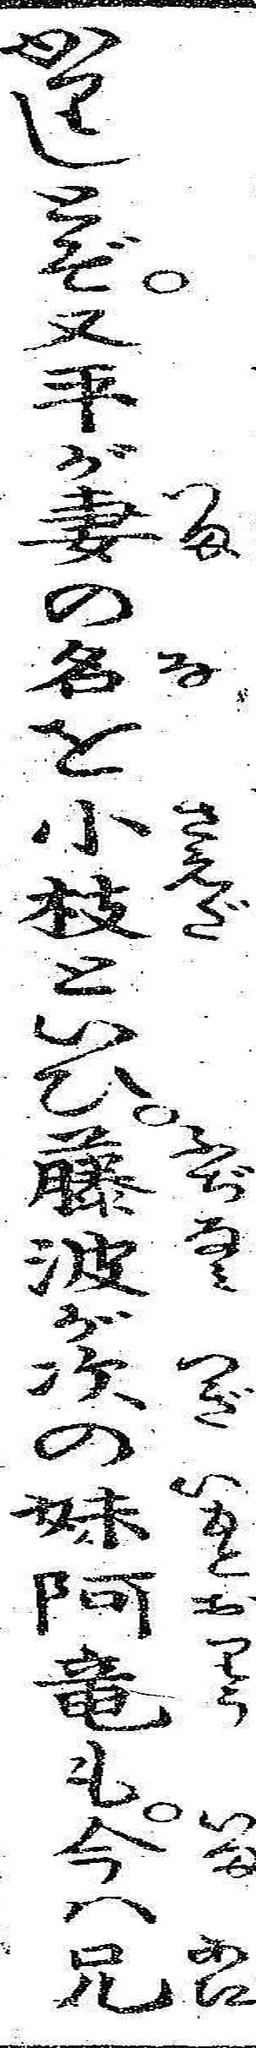かりしとぞ。又平が妻の名を小枝といひ。藤波が次の妹阿竜も。今は兄
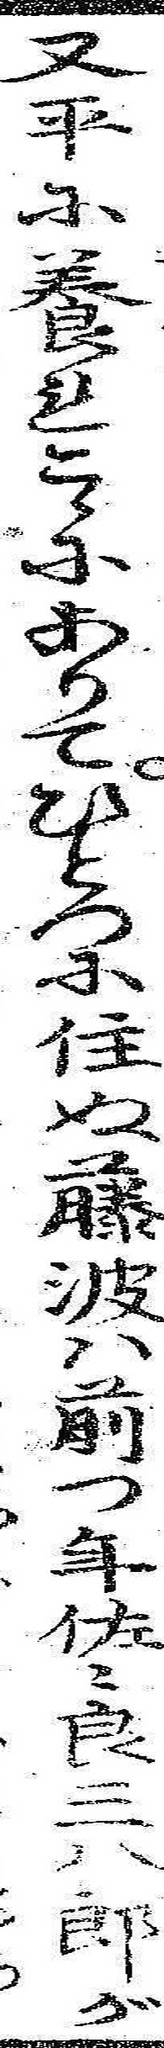又平に養れこゝにありて。ひとつに住ぬ。藤波は前つ年佐々良三八郎が
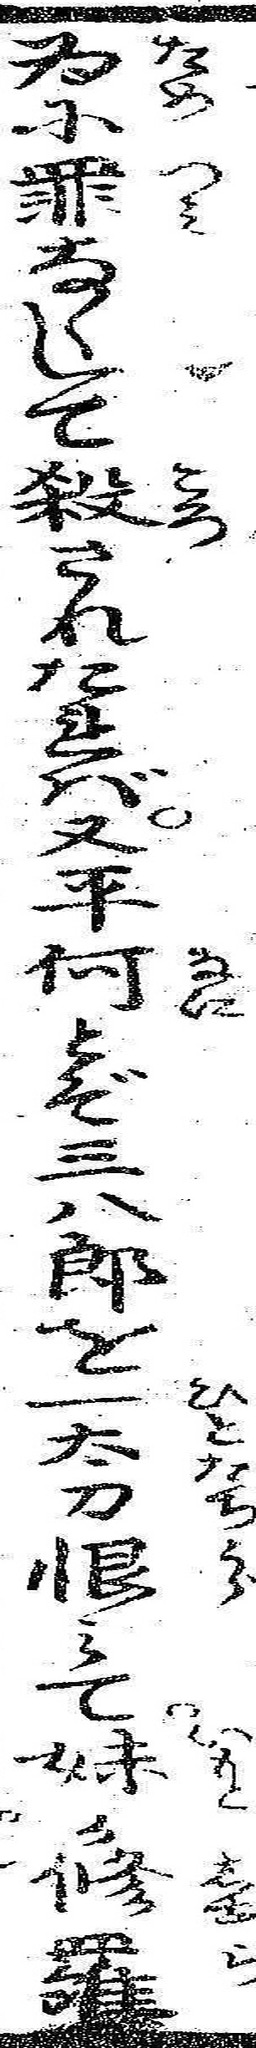為に罪なくして殺されたれば。又平何とぞ三八郎を一太刀恨みて。妹か修羅
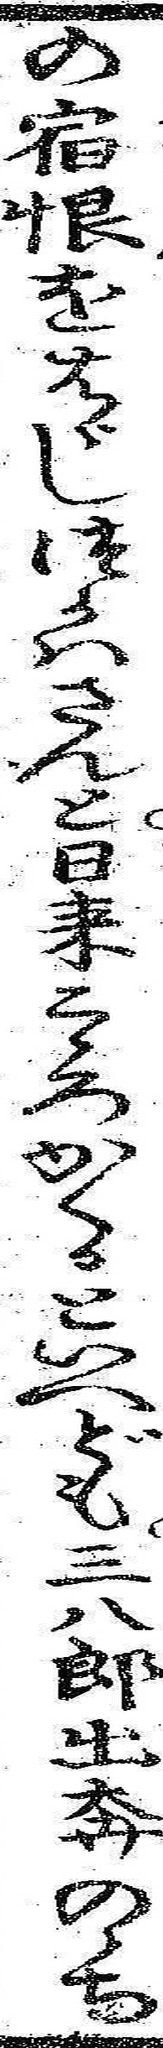の宿恨をはらしつかはさんと。日来こゝろかくるといへども。三八郎出奔のゝち。
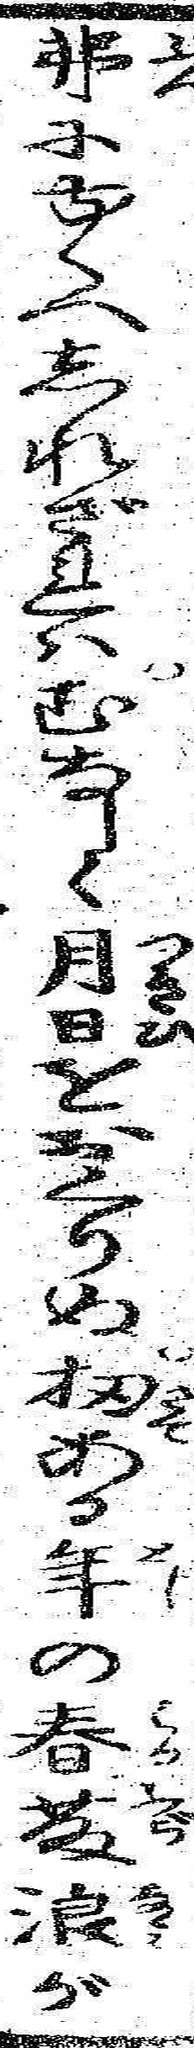弗にゆくへしれざれは。むなしく月日をおくりぬ。扨ある年の春藤浪が
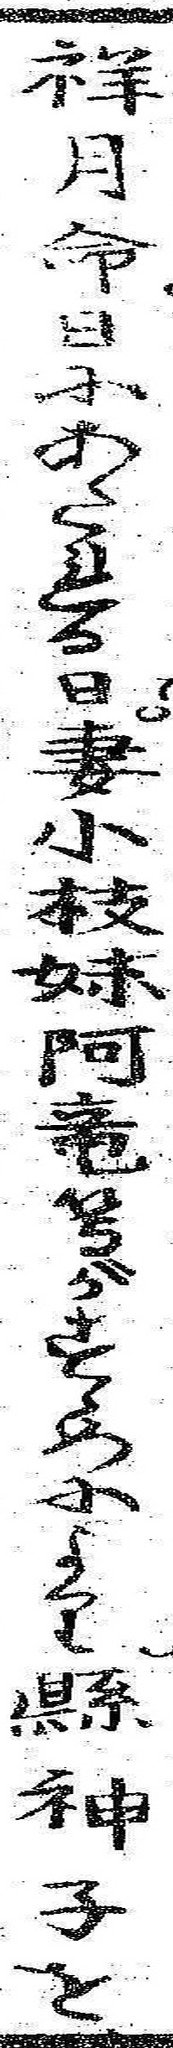祥月命日にあたれる日。妻小枝妹阿竜等がすゝめにより。縣神子を
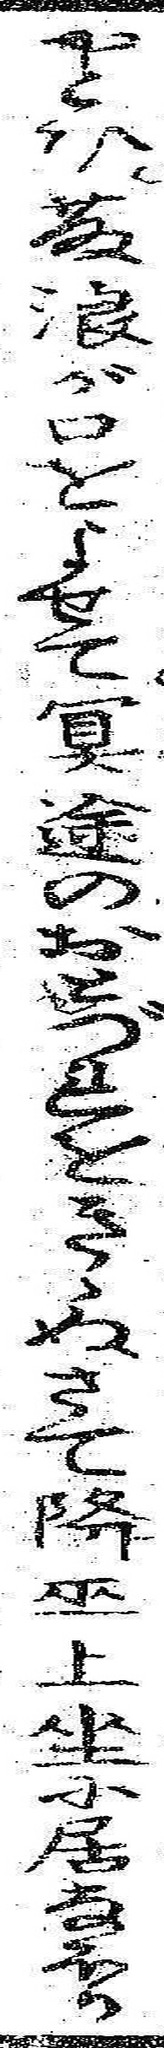やとひ。藤浪が口をよせて。冥途のおとづれをきゝぬさて降巫上坐に居なほり
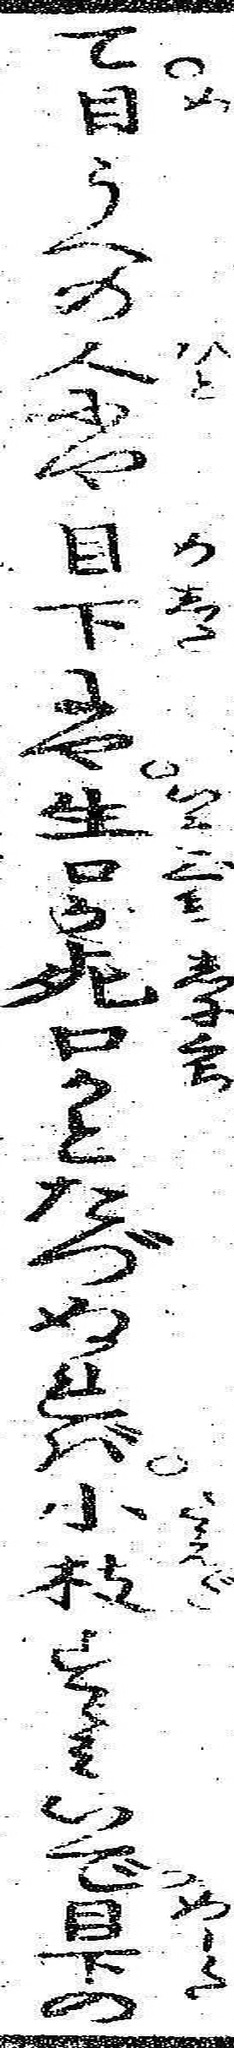て。目うへの人にや目下にや。生口か死口かとたづぬれば。小枝すゝみいで。目下の
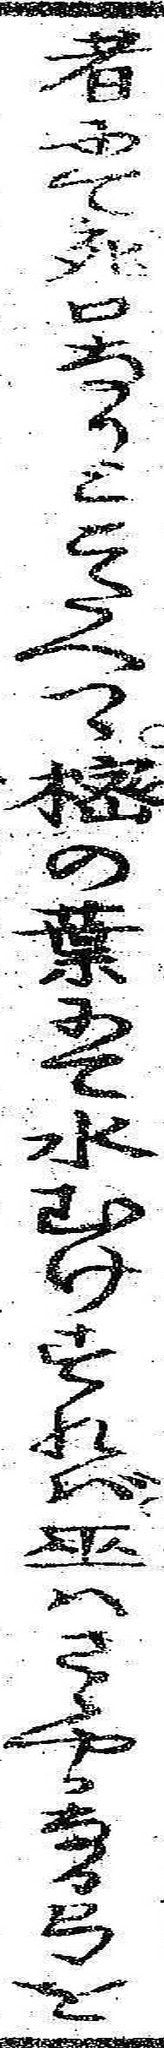者にて死口なりとこたへつゝ。樒の葉にて水むけすれば。巫はさゝやかなる弓を
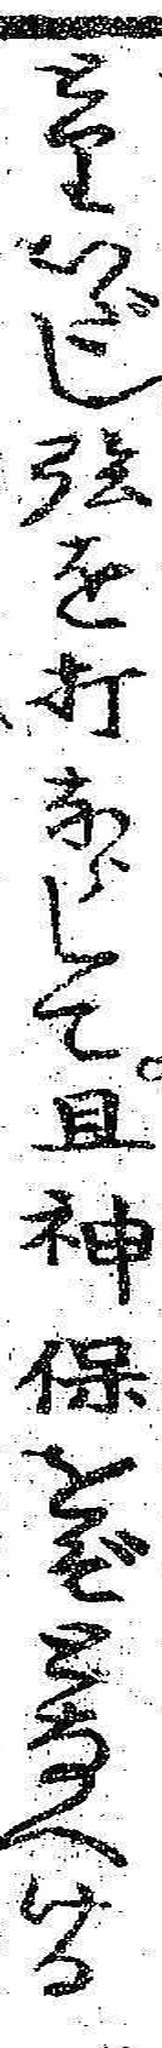とりいだし。弦を打ならして。且神保をぞとなへける
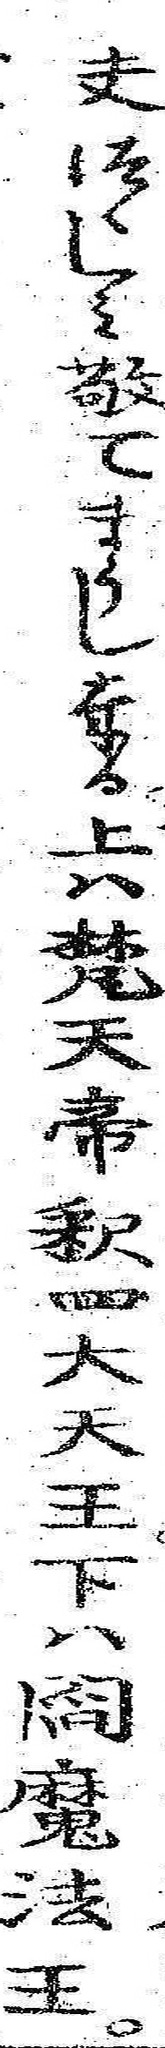夫つゝしみ敬てまうし奉る。上は梵天帝釈四大天王。下は閻魔法王。
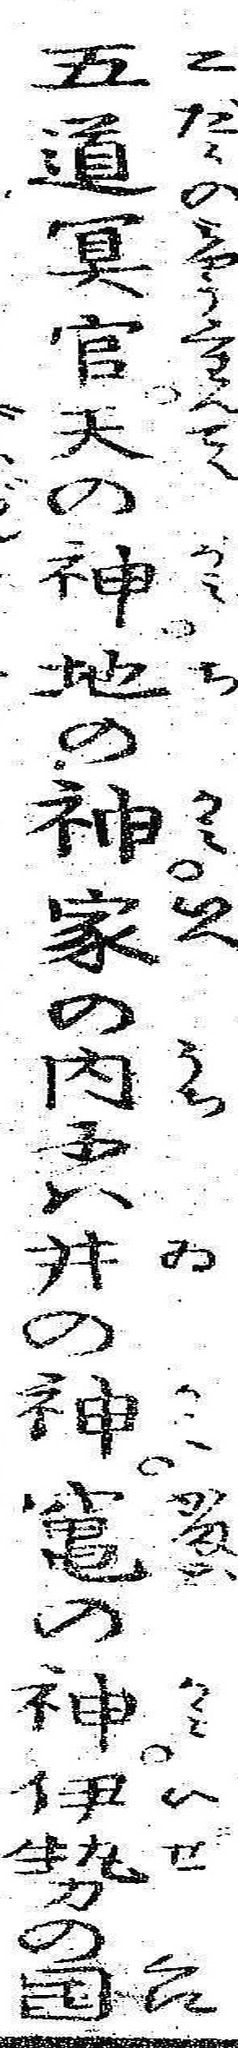五道冥官。天の神。地の神。家の内には井の神。竃の神。伊勢の国
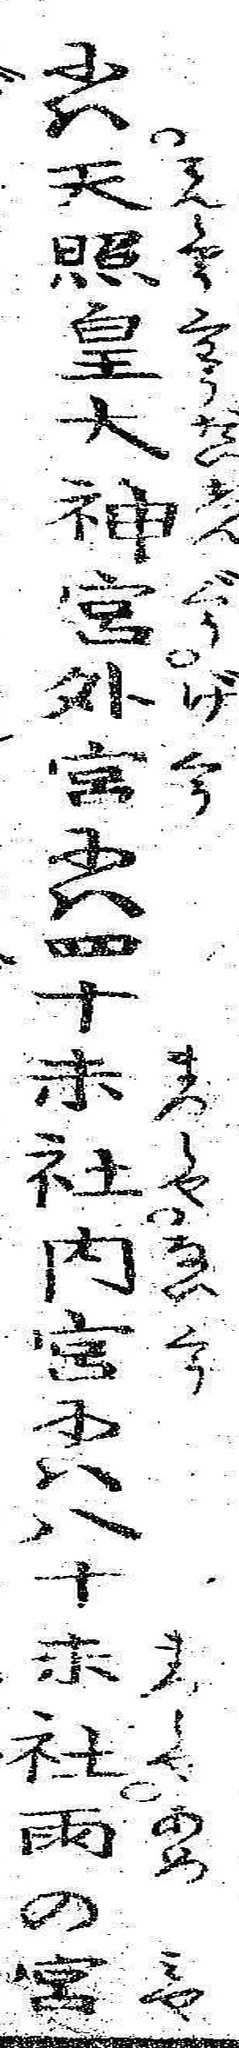には。天照皇大神宮。外宮には四十末社。内宮には八十末社。雨の宮
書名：昔話稲妻表紙
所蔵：国文学研究資料館
